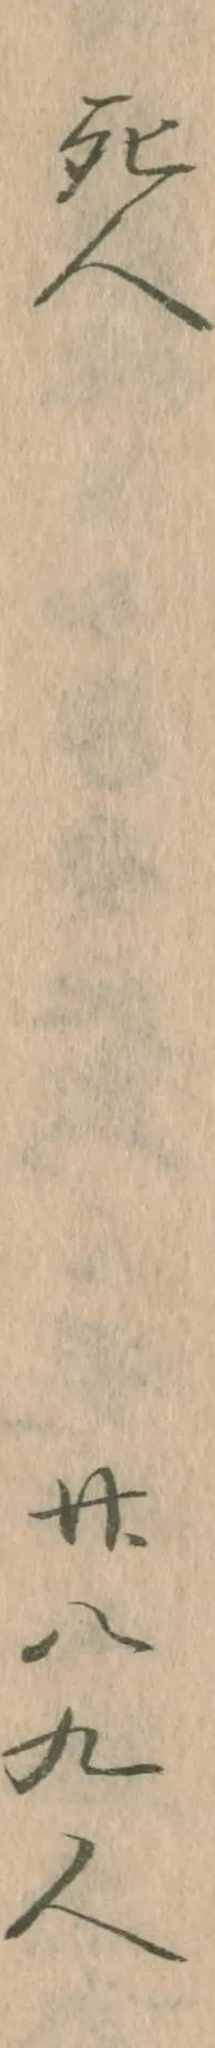死人廿八九人
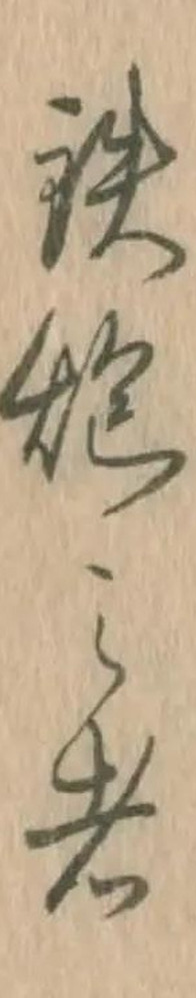鉄炮之者
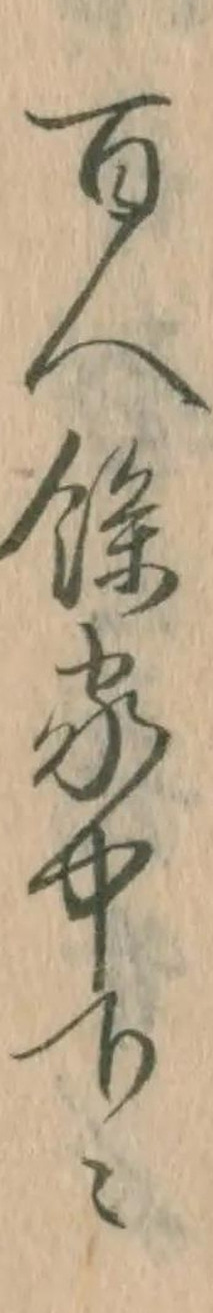百人余家中下々
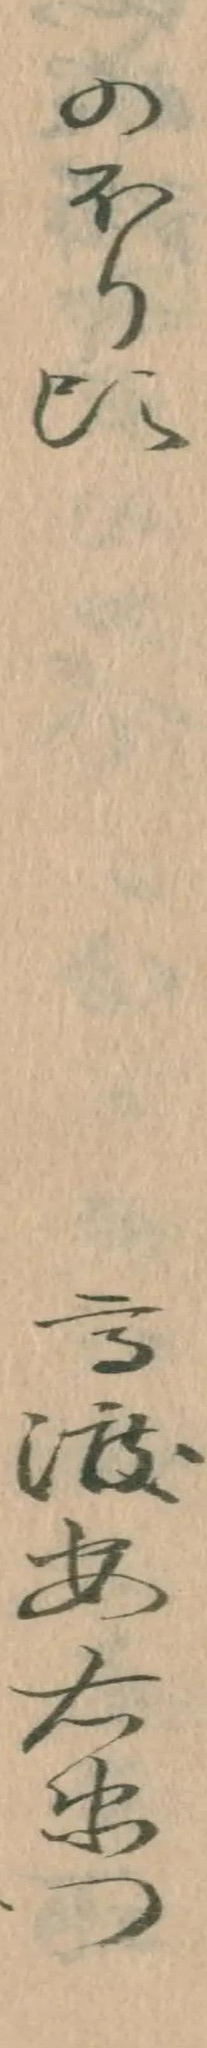の不り頭高渡安右衛門
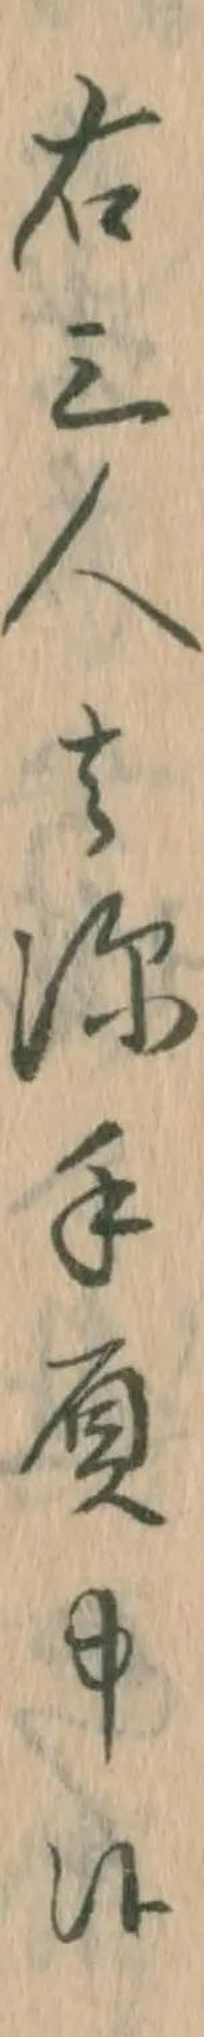右三人者深手負申候
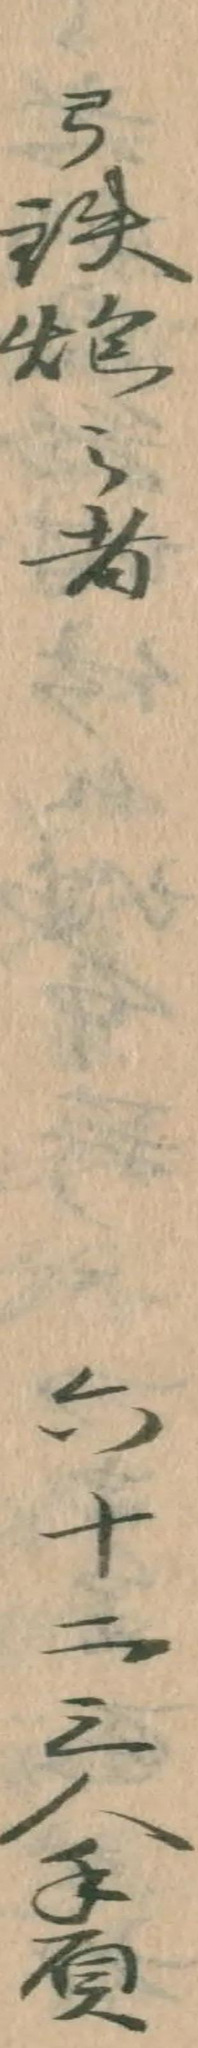弓鉄炮之者六十二三人手負
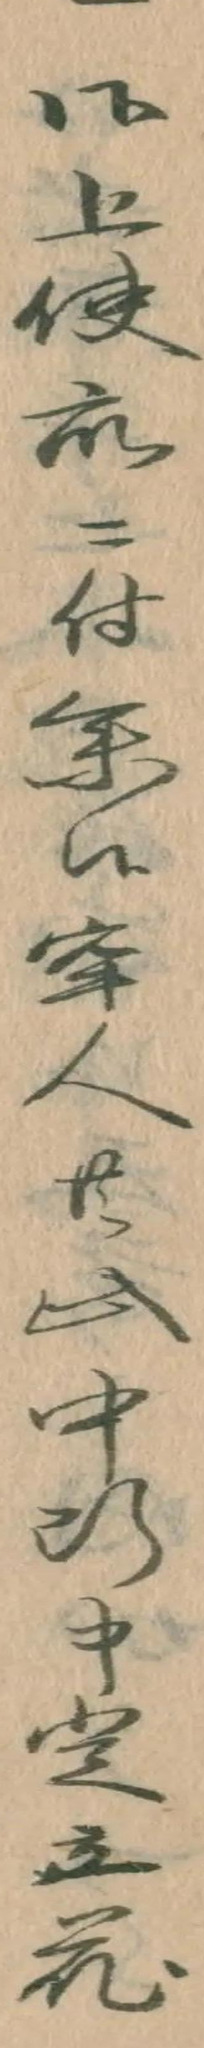一御上使衆に付参候牢人共此中断申定立花
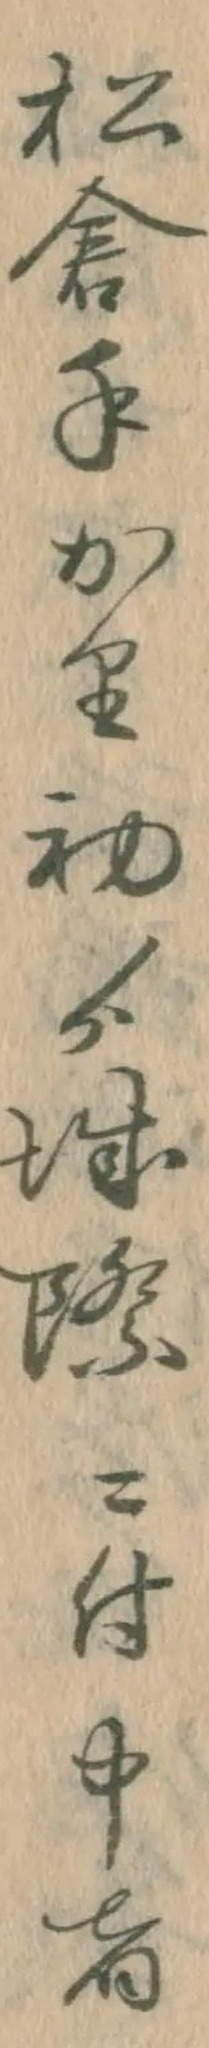松倉手か里初ゟ城際に付申旨
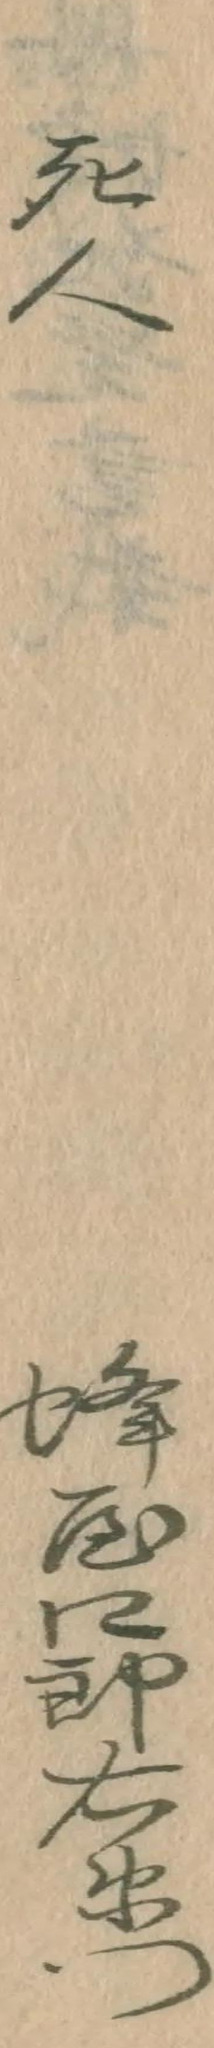死人蜂屋四郎右衛門
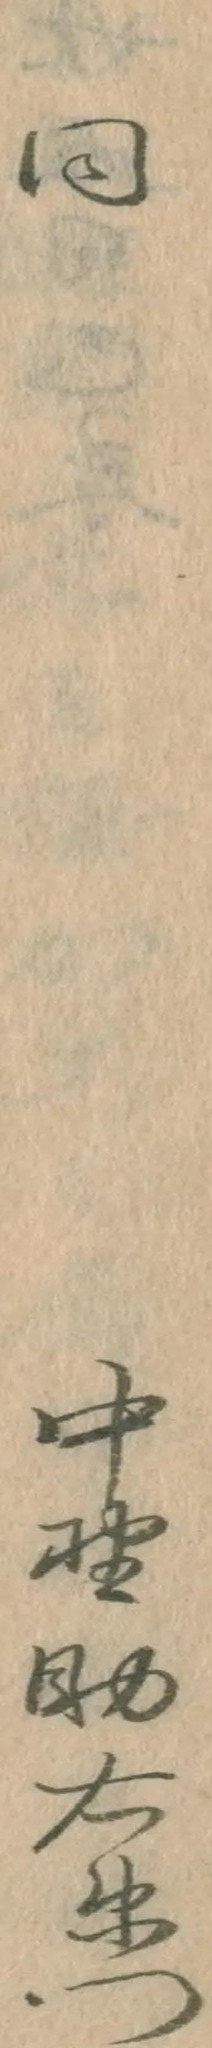同中野助右衛門
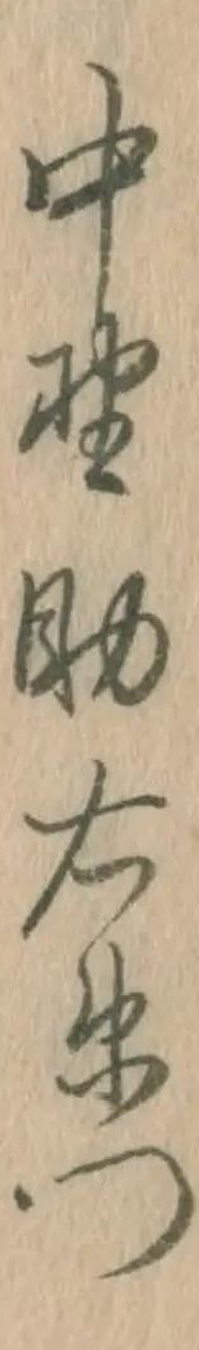同中野助右衛門
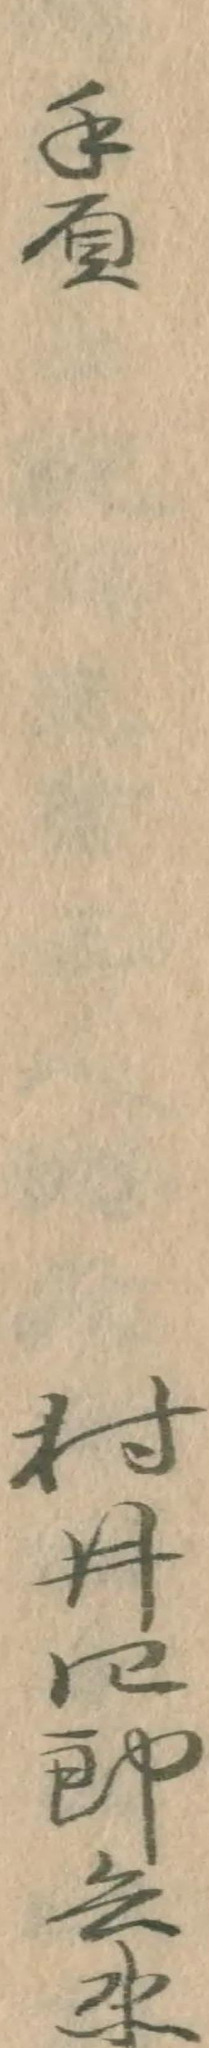手負村井四郎兵衛
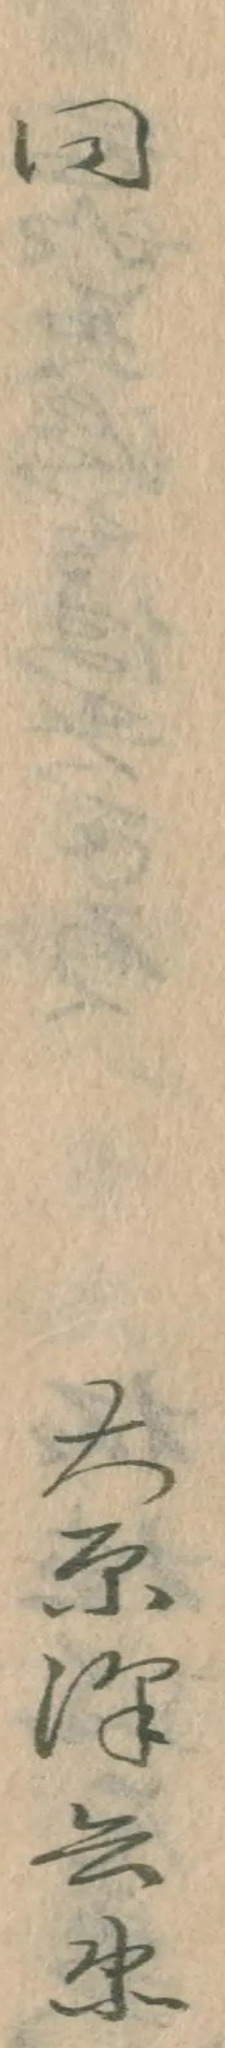同大原沢兵衛
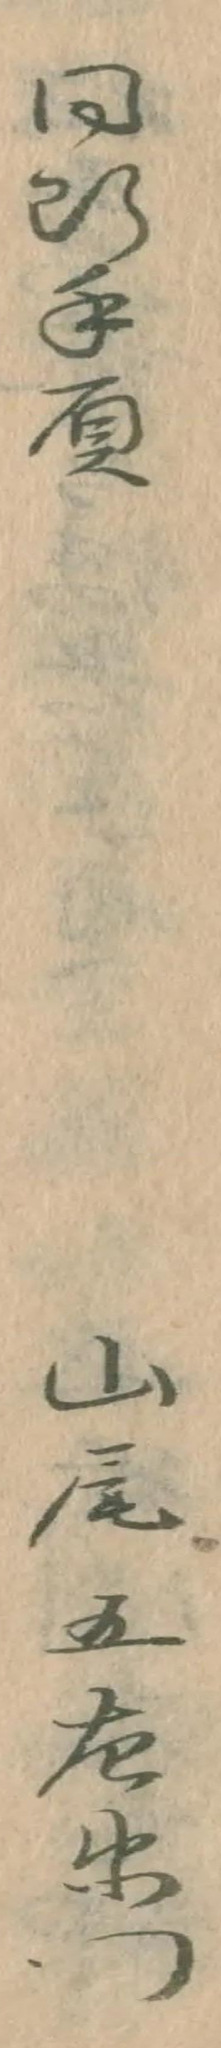同断手負山尾五左衛門

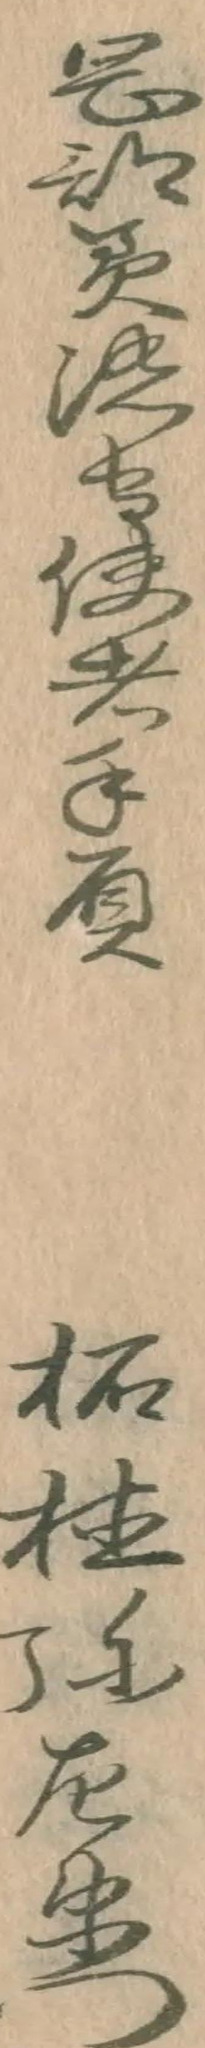岡部美濃守使者手負柘植弥左衛門
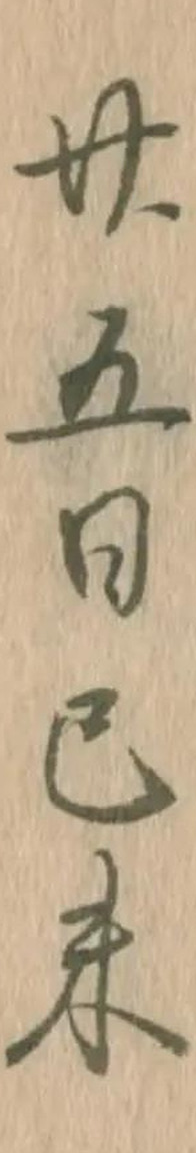廿五日己未
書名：切支丹御退治記 49巻. [4]
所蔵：国立国会図書館 National Diet Library, JAPAN
